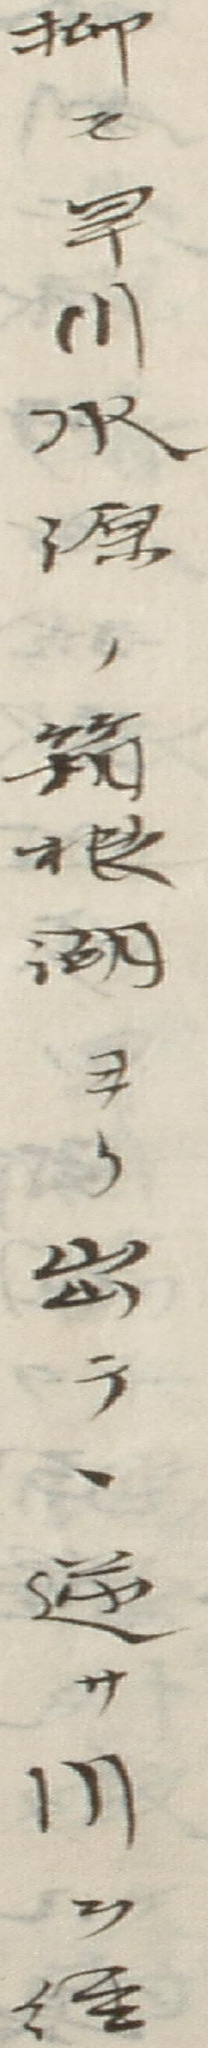抑モ早川水源ノ箱根湖ヨリ出テヽ逆サ川ヲ経
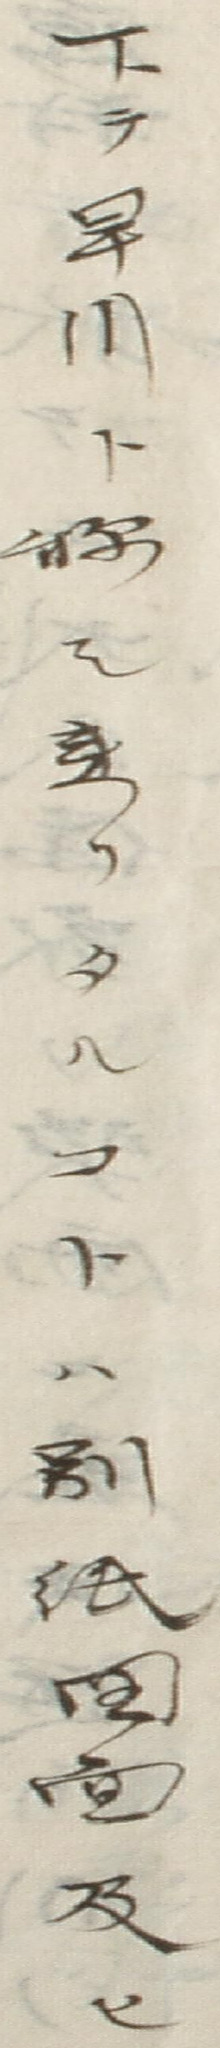下テ早川ト称シ来リタルコトハ別紙図面及ヒ
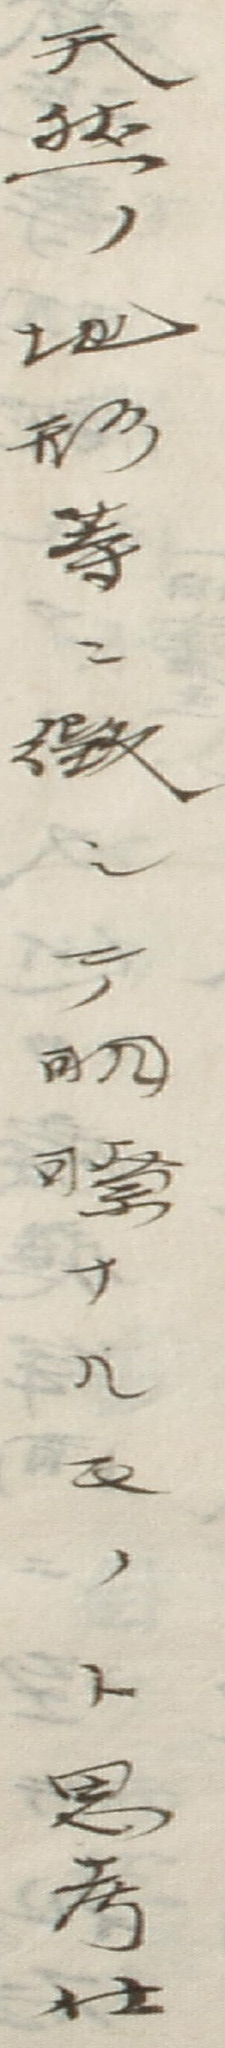天然ノ地形等ニ徴シテ明瞭ナルモノト思考仕
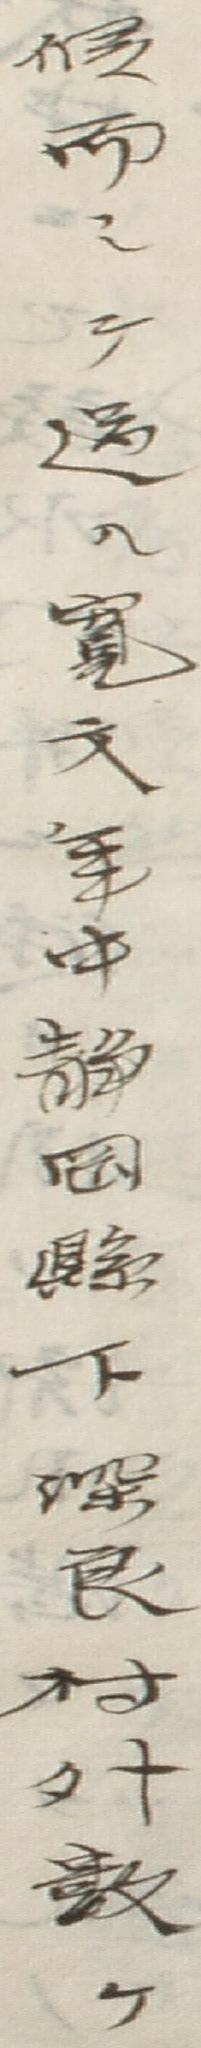候而シテ過ル寛文年中静岡県下深良村外数ケ
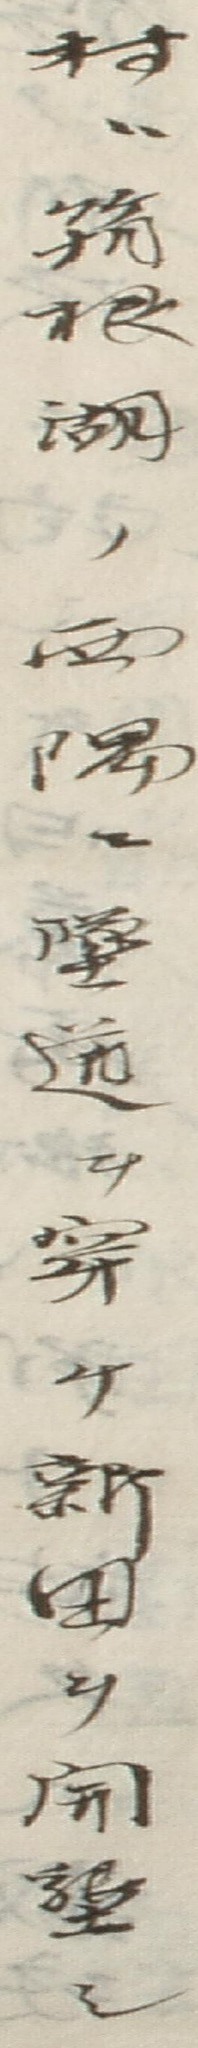村ハ箱根湖ノ西隅ニ墜道ヲ穿チ新田ヲ開墾シ
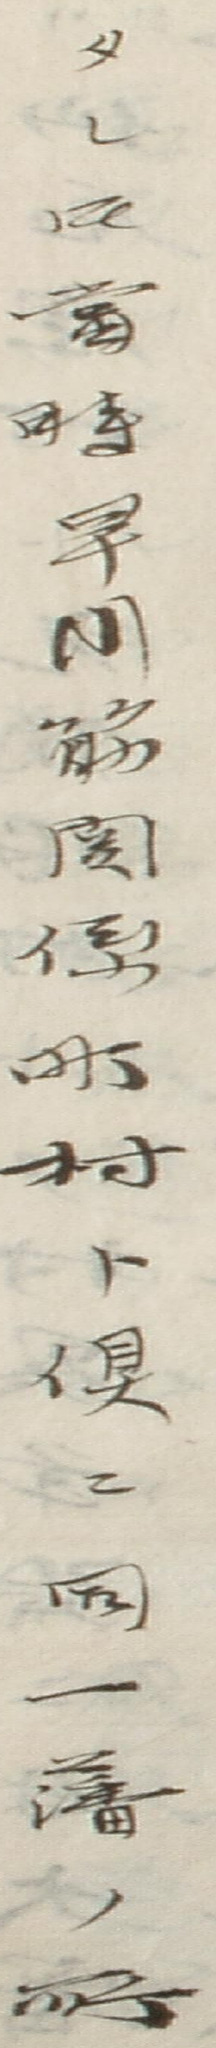タレトモ当時早川筋関係町村ト俱ニ同一藩ノ所
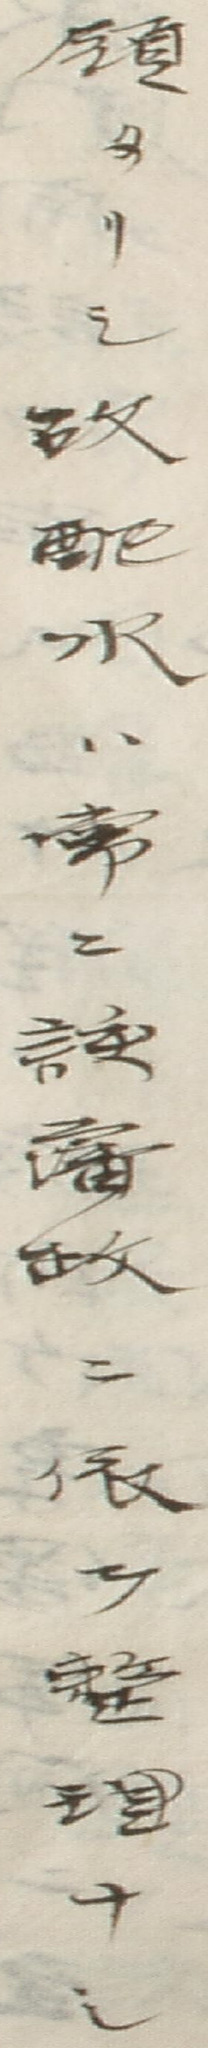領タリシ故配水ハ常ニ該藩政ニ依テ整理ナシ
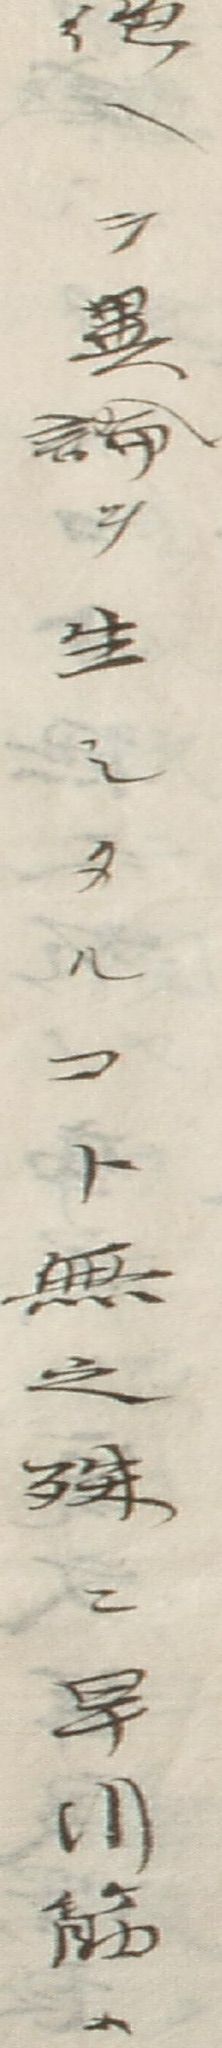絶ヘテ異論ヲ生シタルコト無之殊ニ早川筋ハ
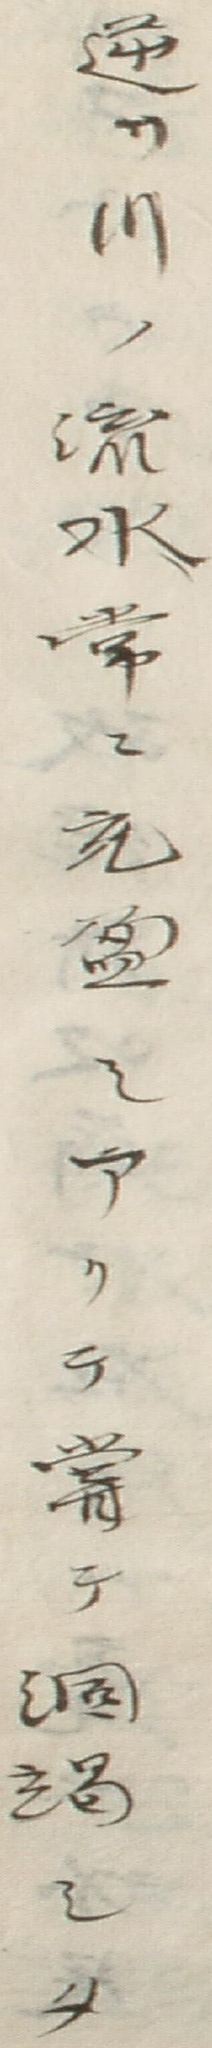逆サ川ノ流水常ニ充盈シアリテ嘗テ涸竭シタ

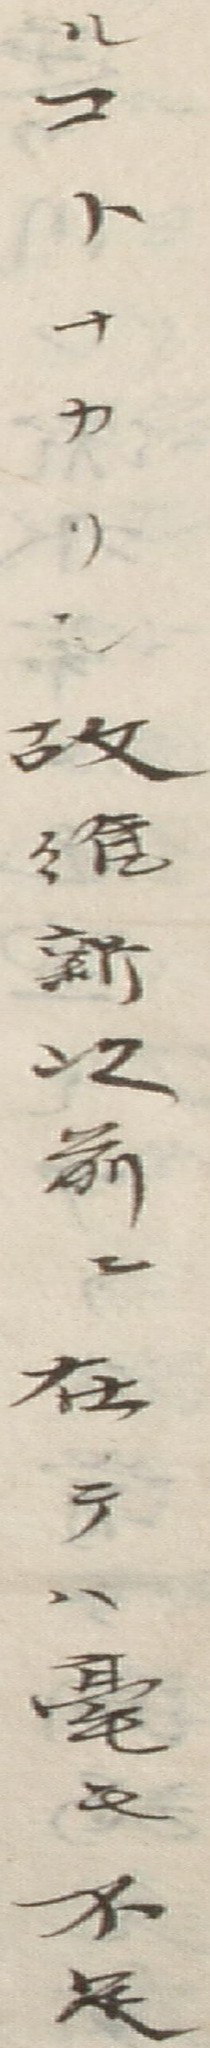ルコトナカリシ故維新以前ニ在テハ毫モ不足
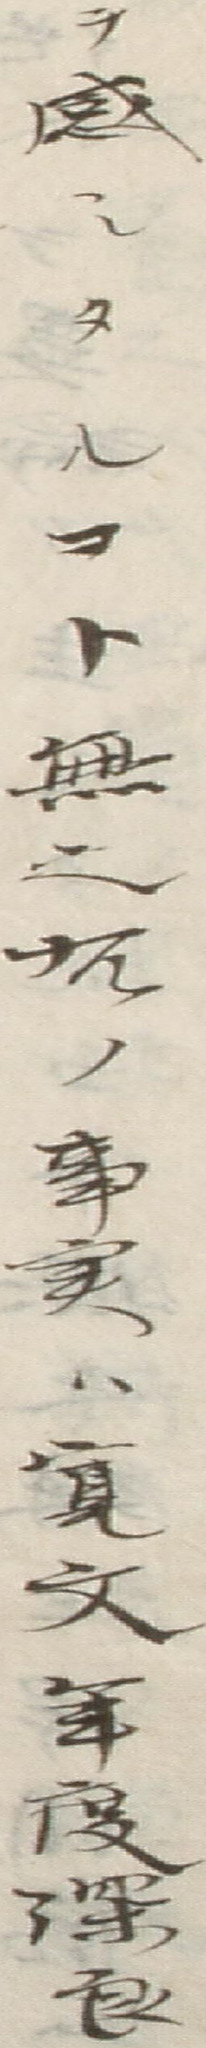ヲ感シタルコト無也右ノ事実ハ寛文年度深良
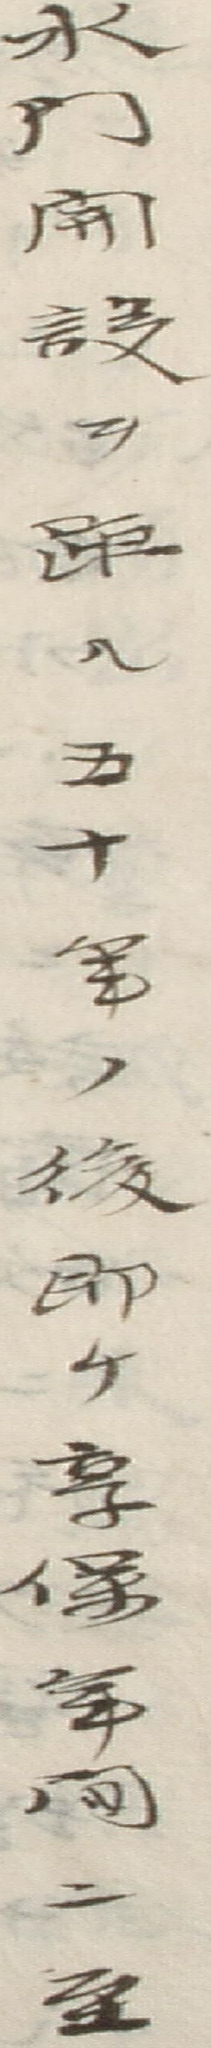水門開設ヲ距ル五十年ノ後即チ享保年間ニ至
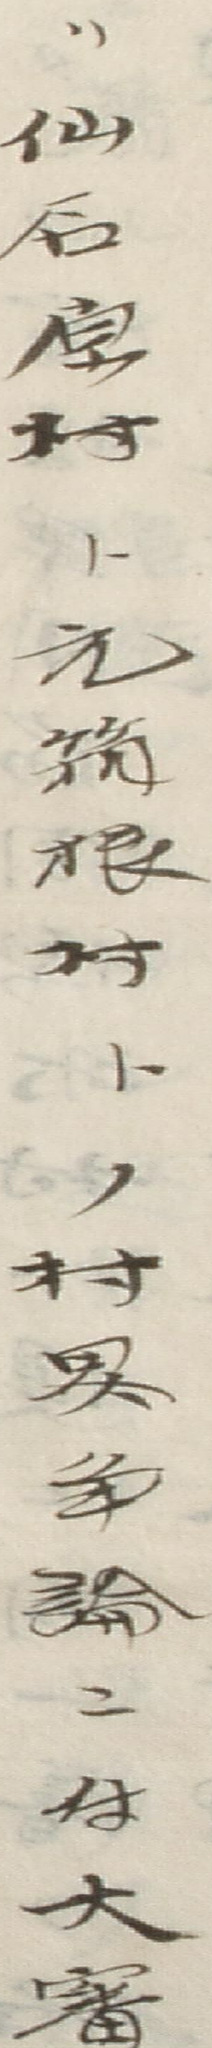リ仙石原村ト元箱根村トノ村界争論ニ付大審
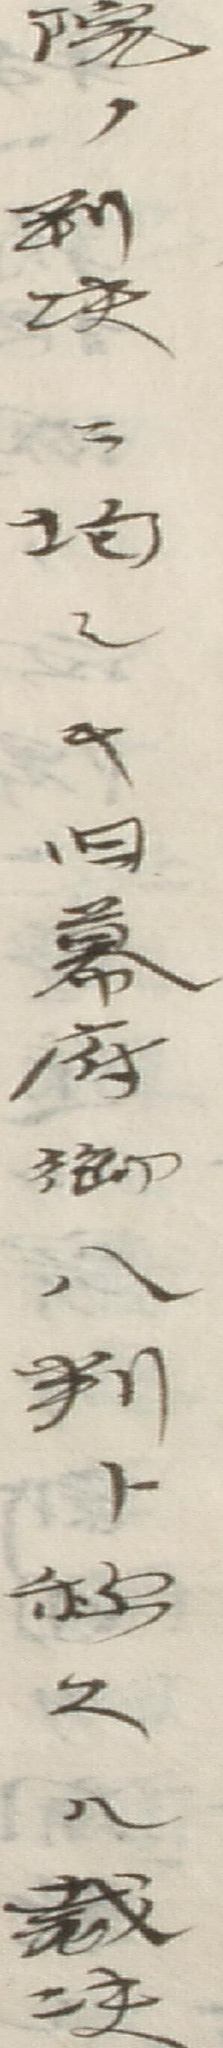院ノ判決ニ均シキ旧幕府御八判ト称スル裁決
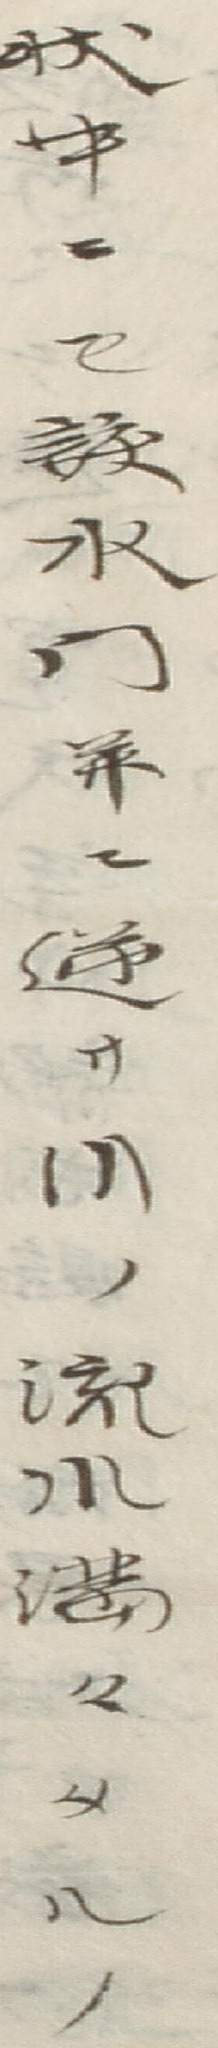状中ニモ該水門并ニ逆サ川ノ流水満々タルノ
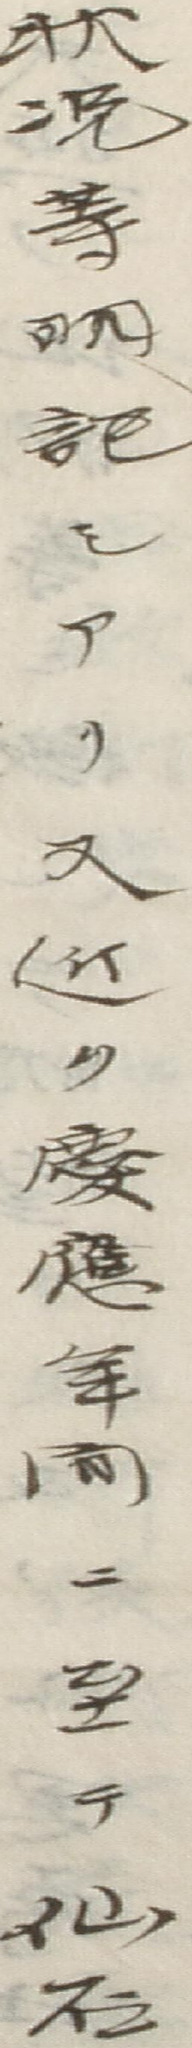状況等明記シアリ又近ク慶応年間ニ至テ仙石
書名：箱根湖水使用願　神奈川縣足柄下郡仙石原村外七ヶ町村
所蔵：東京大学地震研究所図書室 Earthquake Research Institute Library, The University of Tokyo, JAPAN
